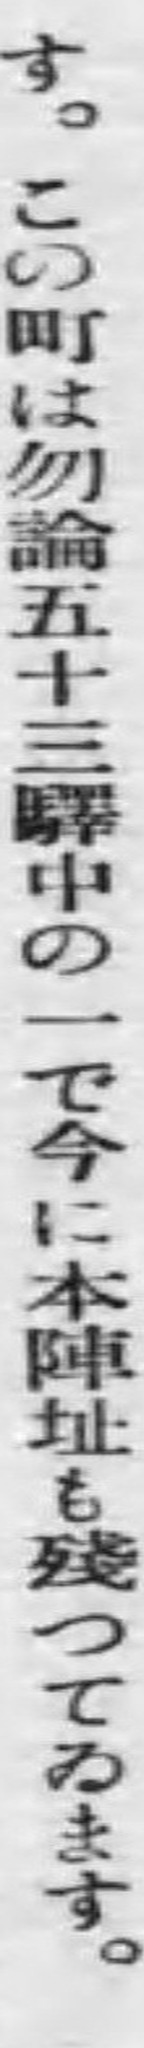す。この町は勿論五十三駅中の一で今に本陣址も残つてゐます。
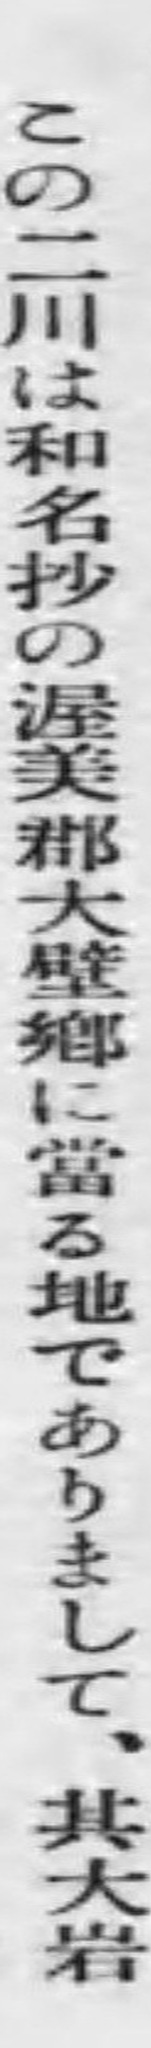この二川は和名抄の渥美郡大壁郷に当る地でありまして、其大岩
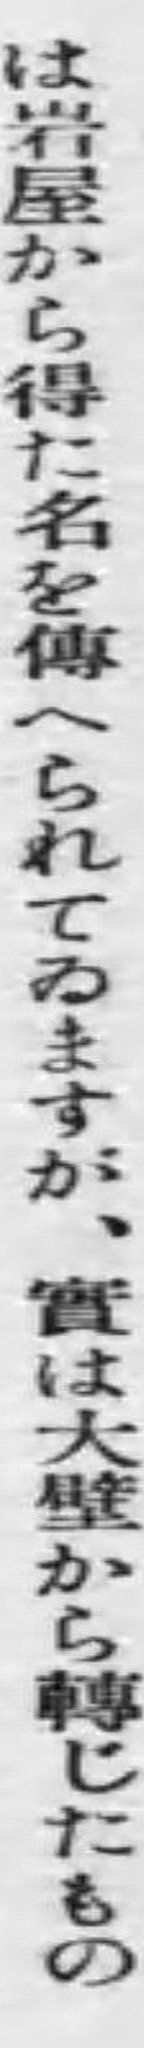は岩屋から得た名を伝へられてゐますが、実は大壁から転じたもの
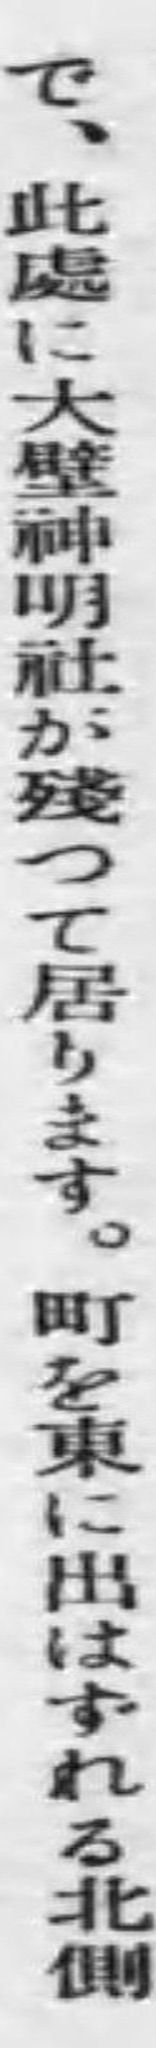で、此処に大壁神明社が残つて居ります。町を東に出はずれる北側
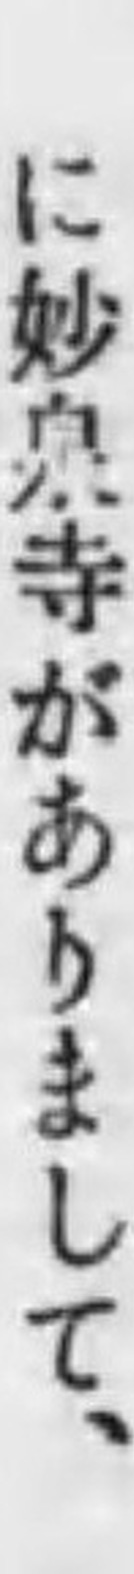に妙泉寺がありまして、
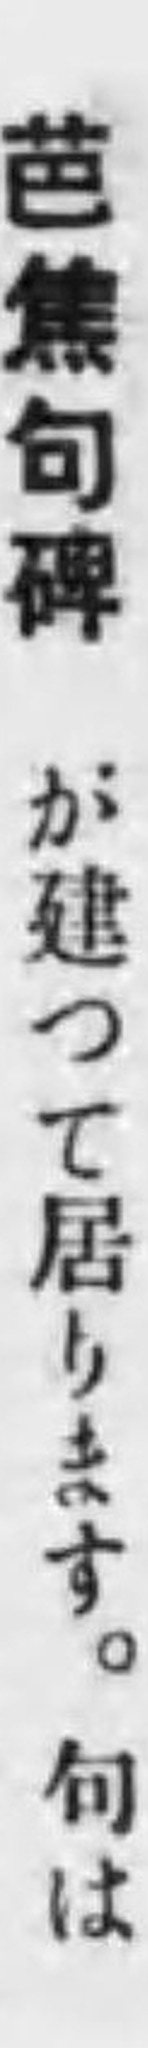芭蕉句碑が建つて居ります。句は
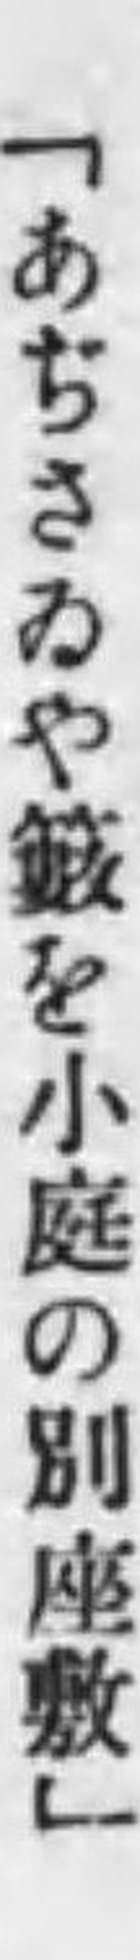「あぢさゐや籔を小庭の別座敷」
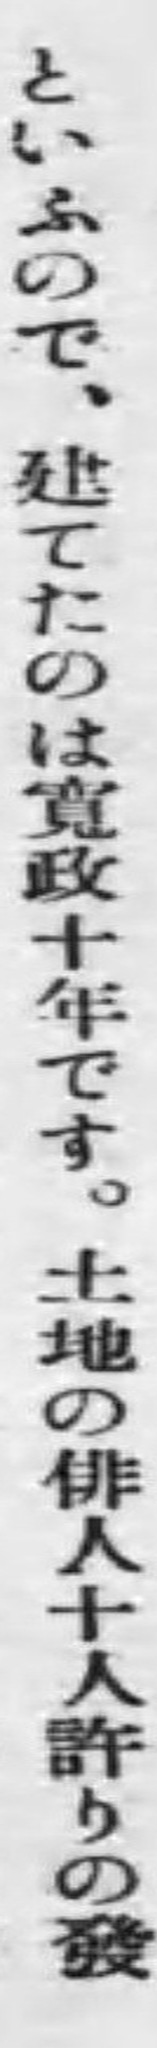といふので、建てたのは寛政十年です。土地の俳人十人許りの発
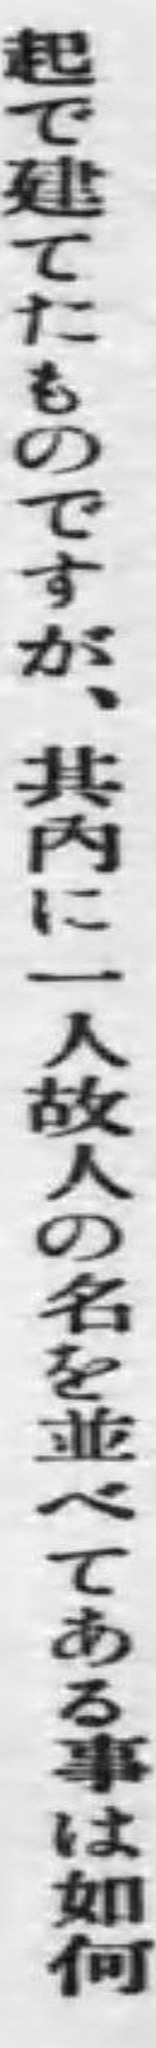起で建てたものですが、其内に一人故人の名を並べてある事は如何
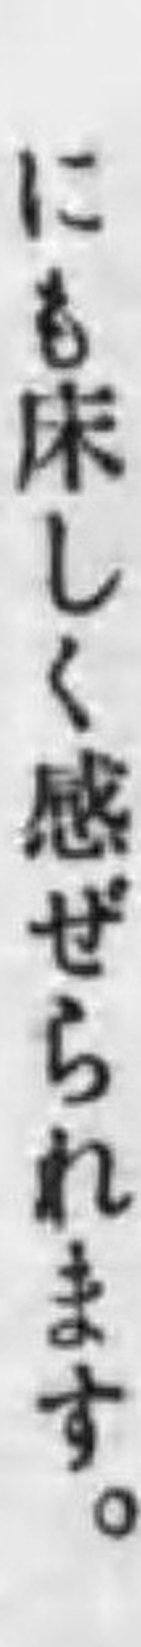にも床しく感ぜられます。
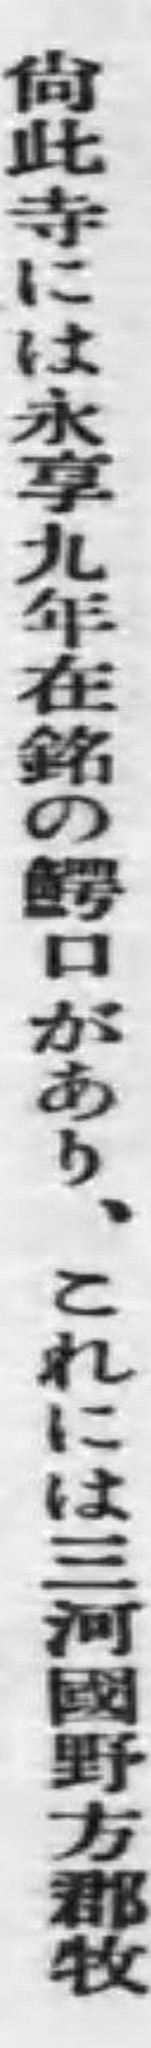尚此寺には永享九年在銘の鰐口があり、これには三河国野方郡牧
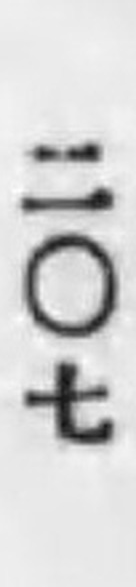二〇七

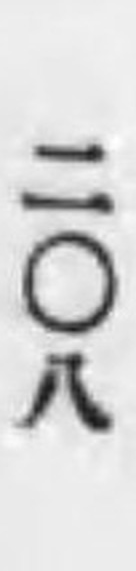二〇八
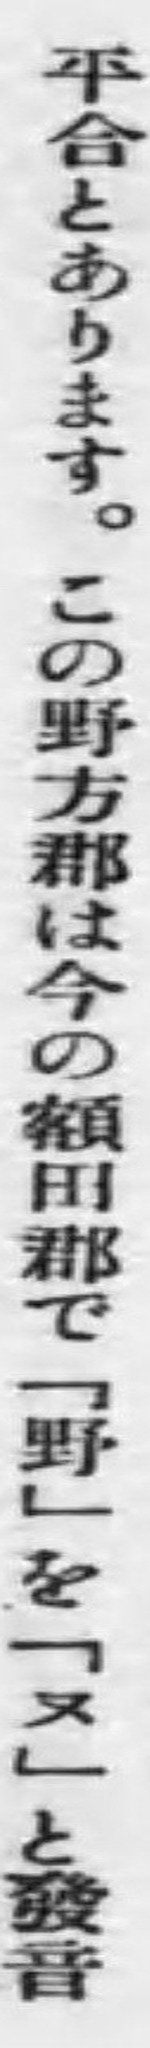平合とあります。この野方郡は今の額田郡で「野」を「ヌ」と発音
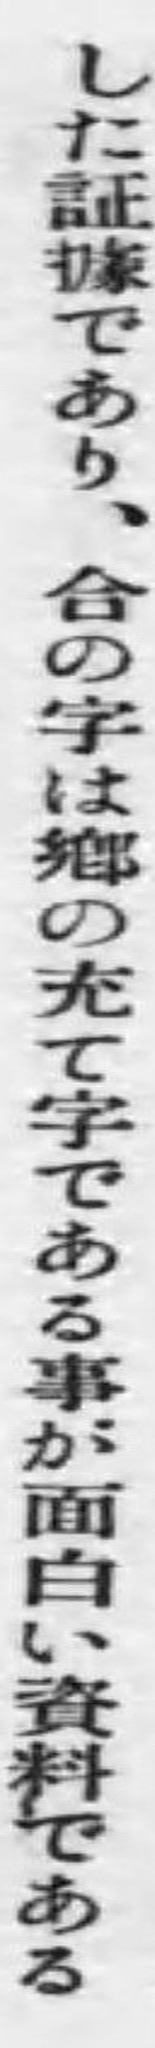した証拠であり、合の字は郷の充て字である事が面白い資料である
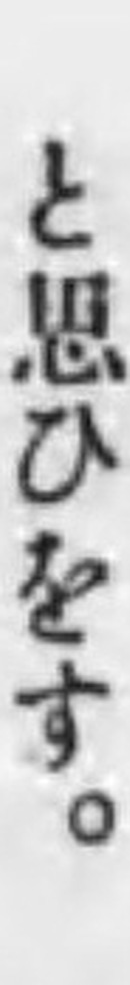と思ひをす。
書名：東三河道中記 : 豊橋市及其附近案内
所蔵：国立国会図書館 National Diet Library, JAPAN
